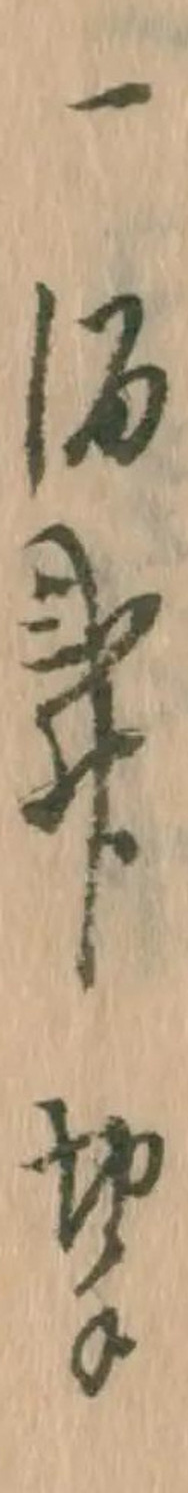一酒弐升仲蔵

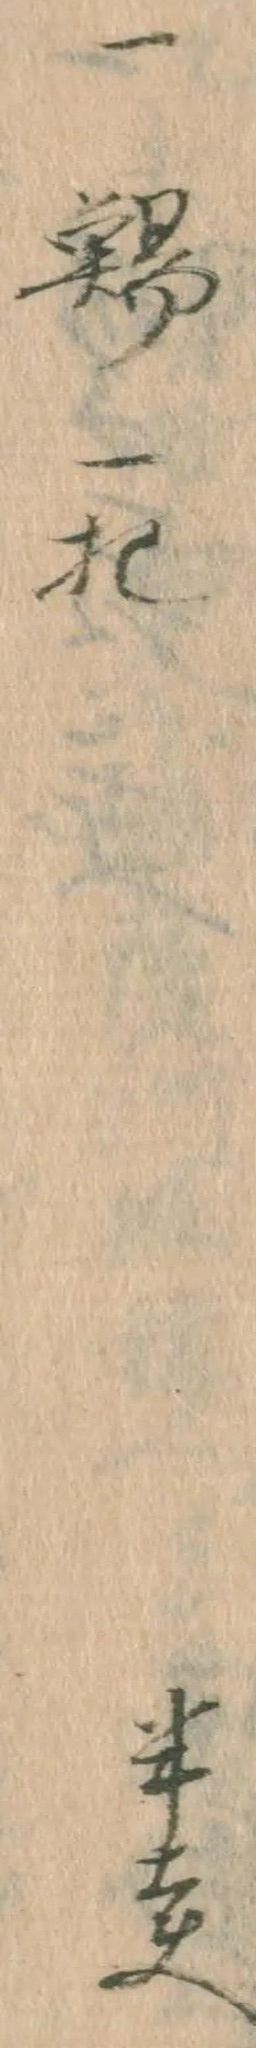一鯣一把半大夫
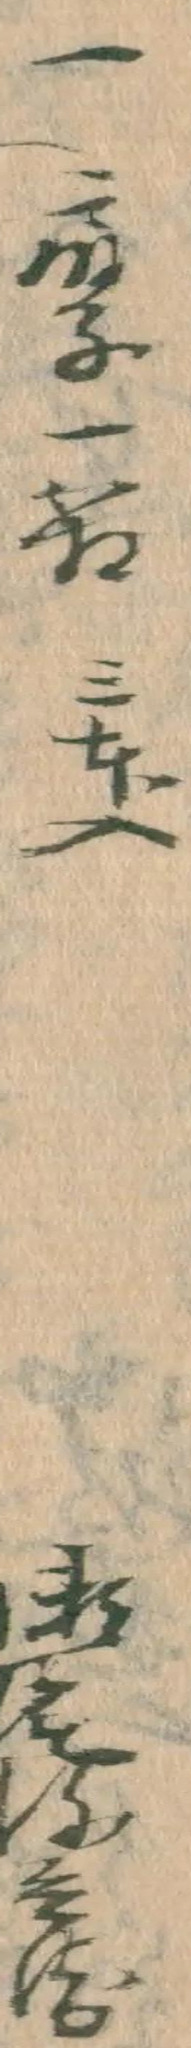一扇子一箱五本入同小兵衛

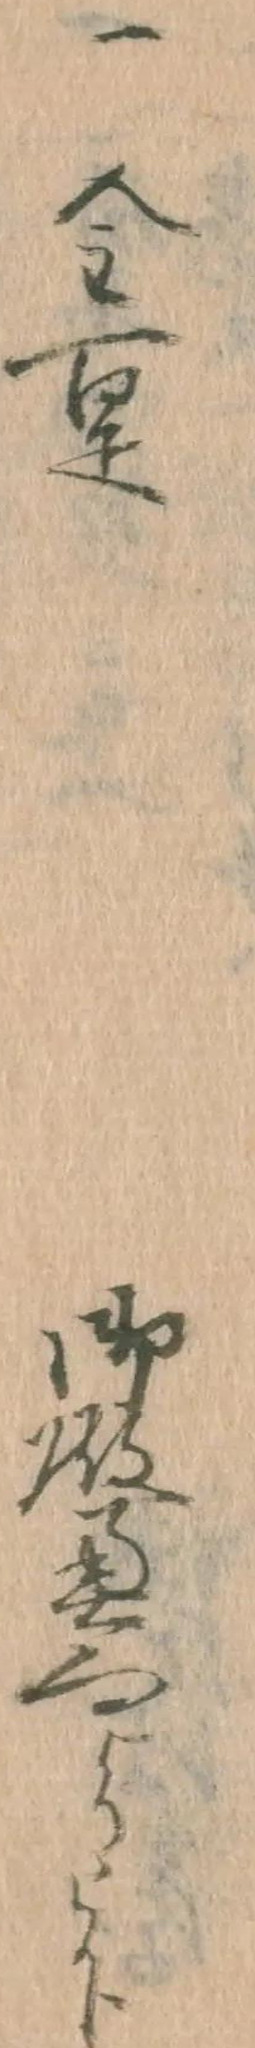一金百疋御殿奥向より被下
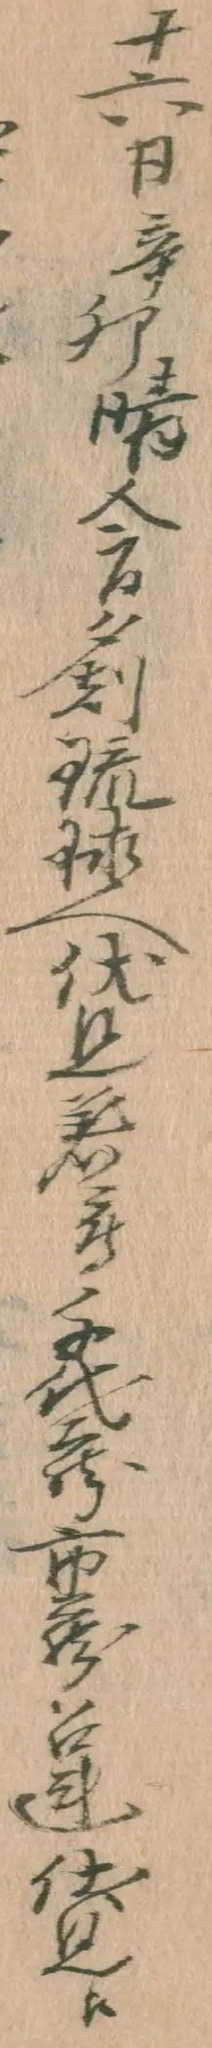十六日辛卯晴今日夕刻琉球人伏見着ニ付千代蔵市蔵召連伏見江
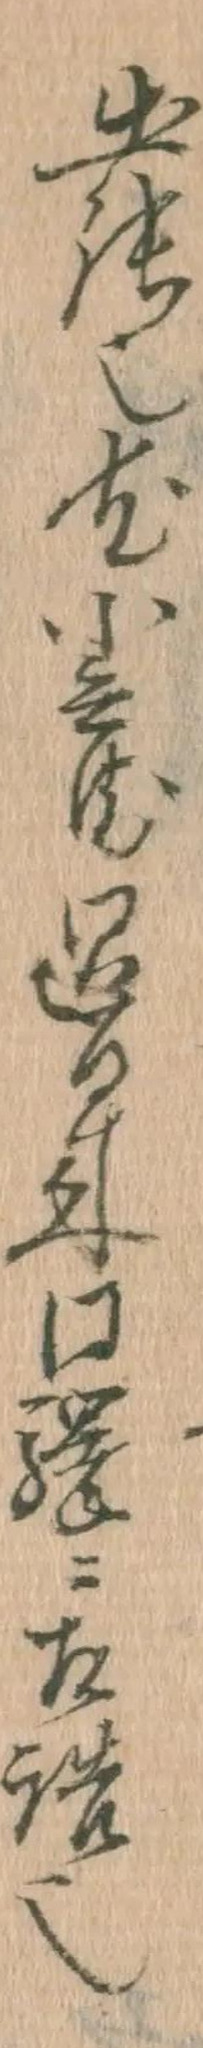出張也尤小兵衛過日来同驛ニ相詰也
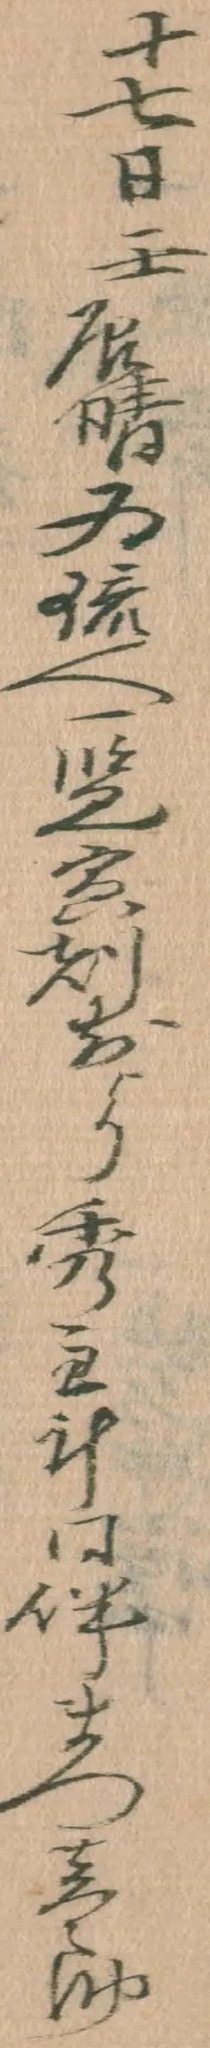十七日壬辰晴為琉人一覧寅刻前より秀主斗同伴まつ壱之助
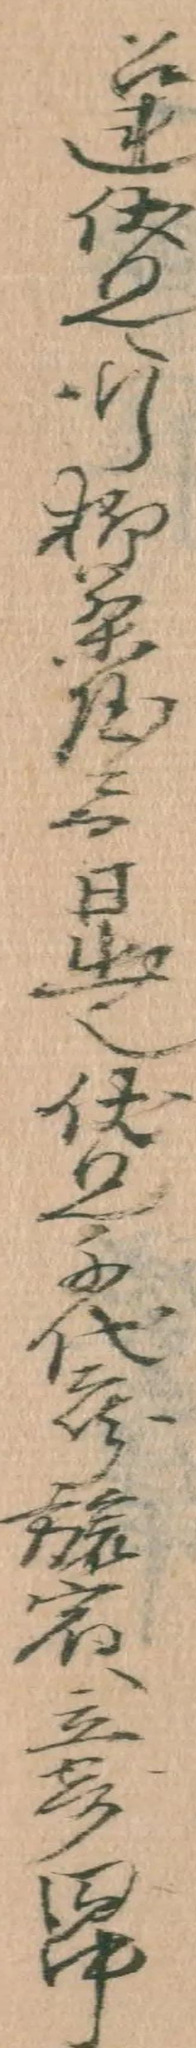召連伏見へ行柳茶屋ニ而日出也伏見千代蔵旅宿へ立寄田中
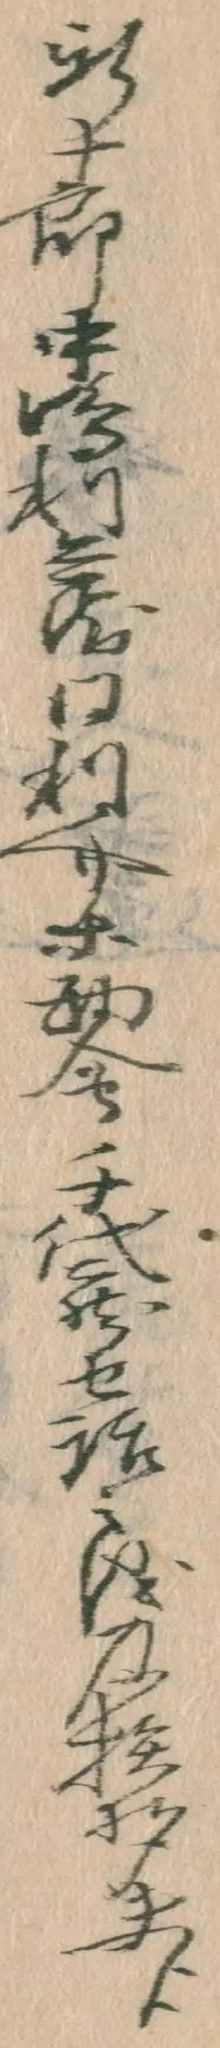新十郎中嶋利兵衛同利介等面會千代蔵世話之儀及挨拶夫ゟ
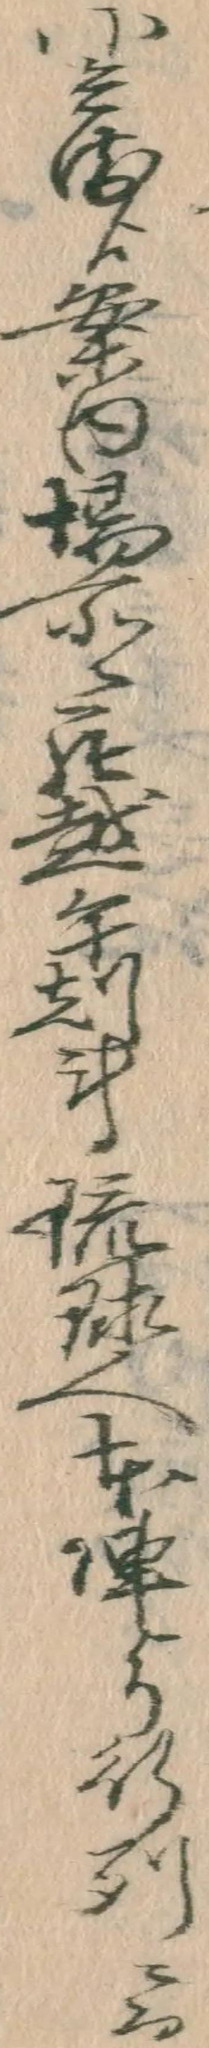小兵衛ゟ案内場所へ罷越午刻斗琉球人本陣より行列ニ而
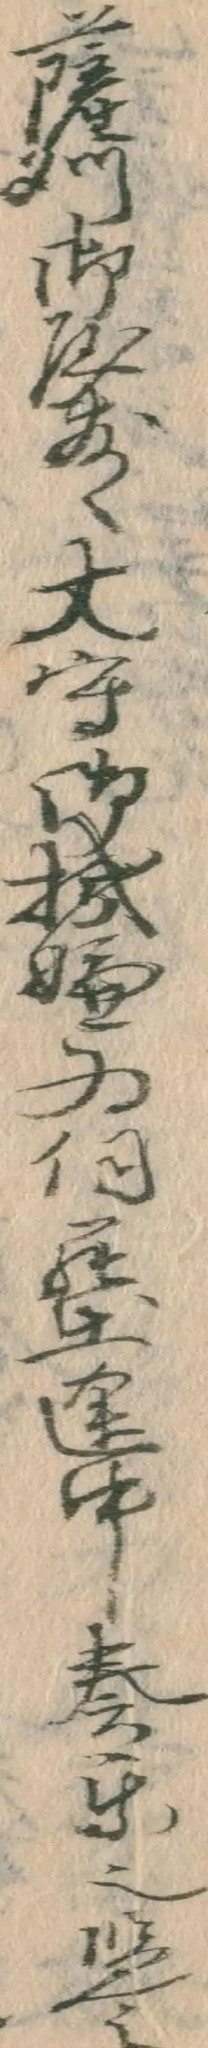薩州御屋敷へ大守御機嫌為伺罷出途中奏楽也覧之
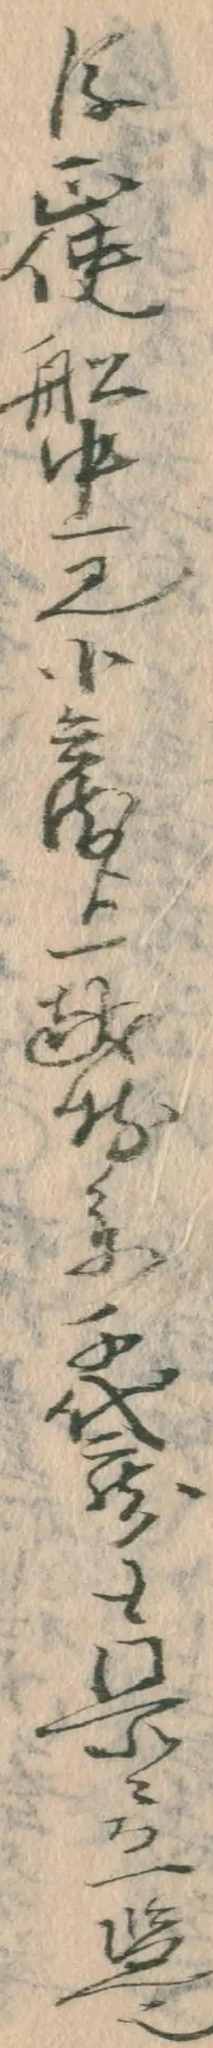後正使船中一見小兵衛ゟ一献持参千代蔵も同所ニ而一覧也
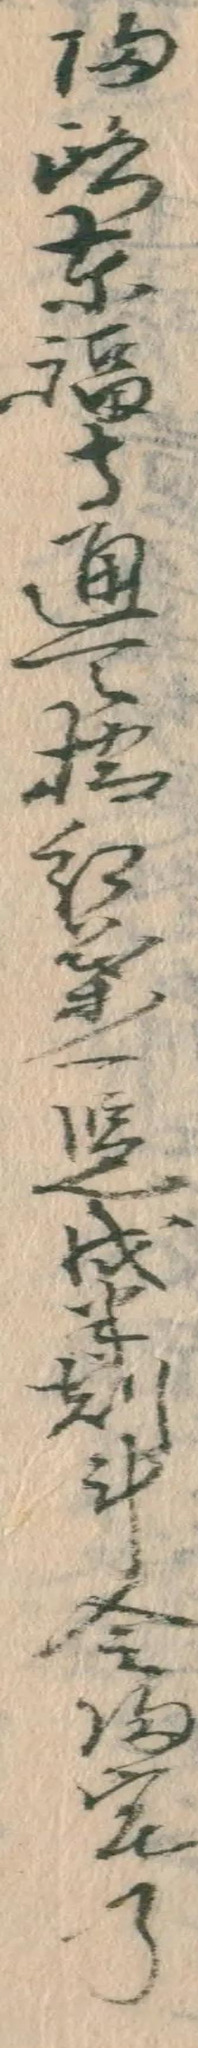帰路東福寺通天橋紅葉一覧戌半刻斗令帰宅了
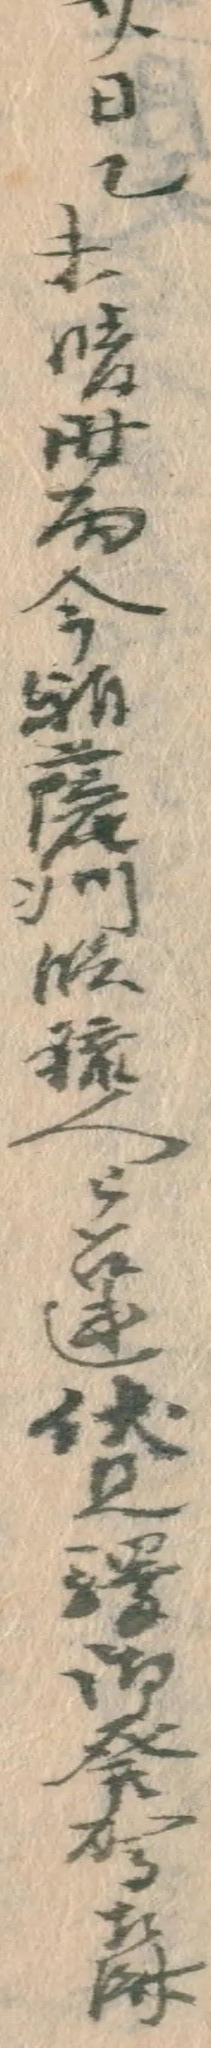廿日乙未晴時雨今朝薩州仮琉人被召連伏見驛御発駕相済
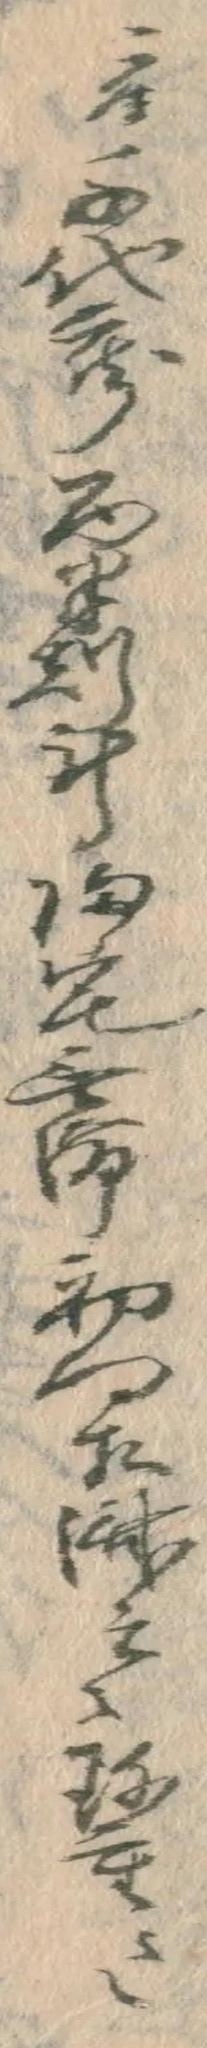二付千代蔵酉半刻斗帰宅無滞初向相済云々珍重々々
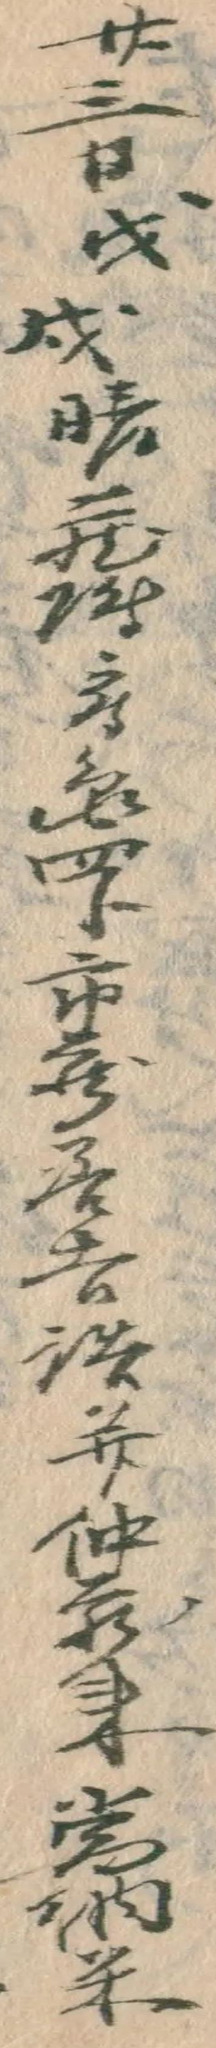廿三日戊戌晴蔵附ニ月亀四郎市蔵善吉諾幷仲蔵米當納米
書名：賀茂社記録. 第69冊
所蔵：国立国会図書館 National Diet Library, JAPAN
